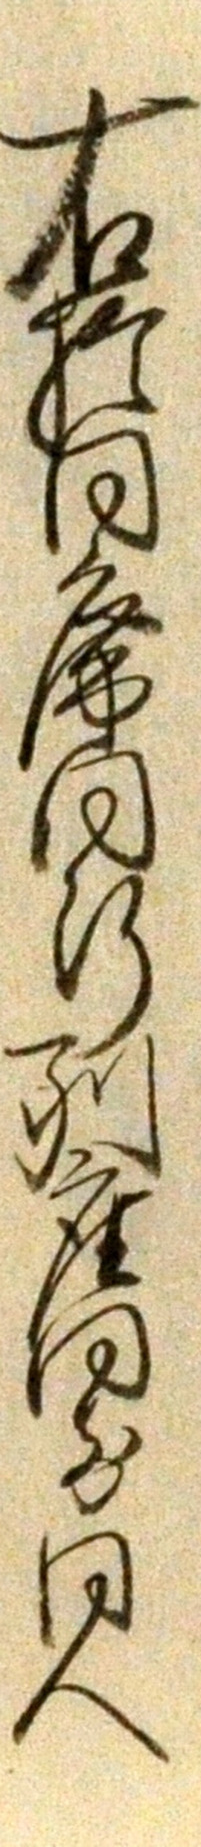右於同席同断列座同前同人
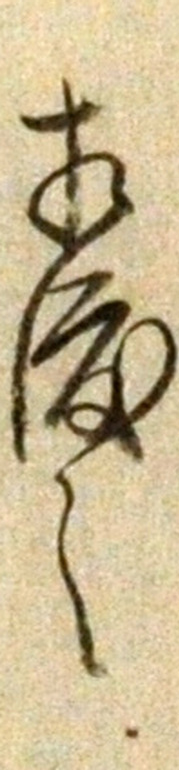相渡之
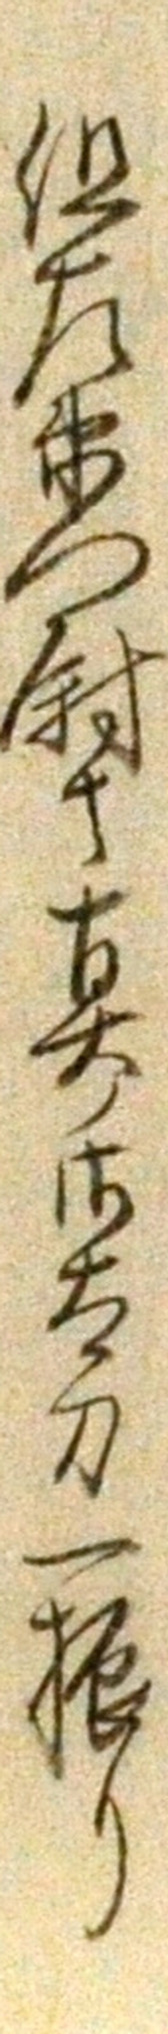但左衛門尉は真ノ御太刀一振り
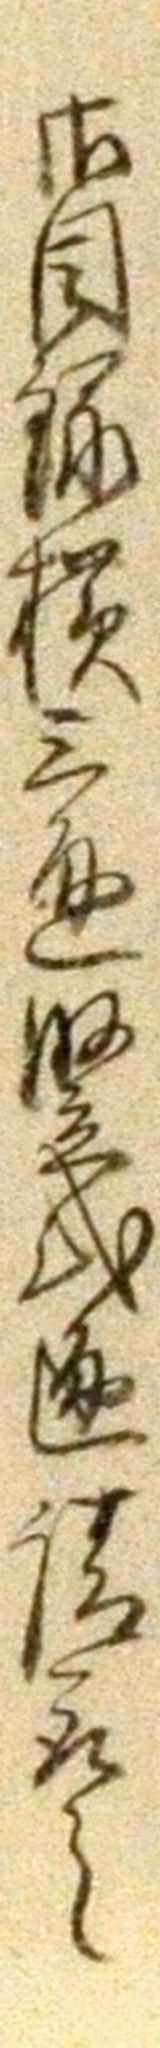御目録横三通竪弐通請取之
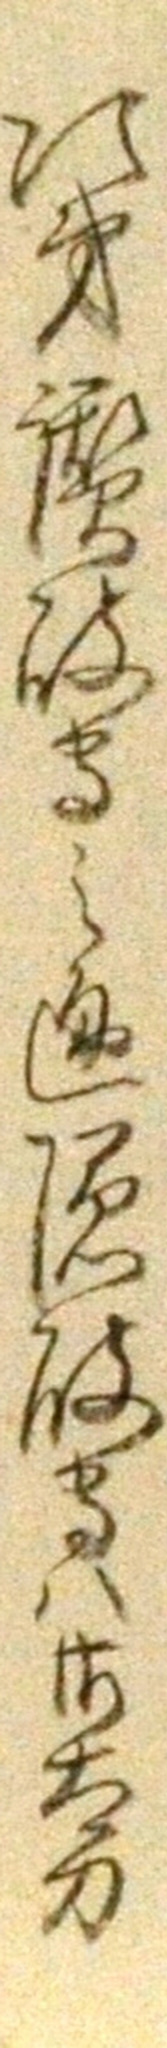次第讃岐守之通隠岐守ハ御太刀

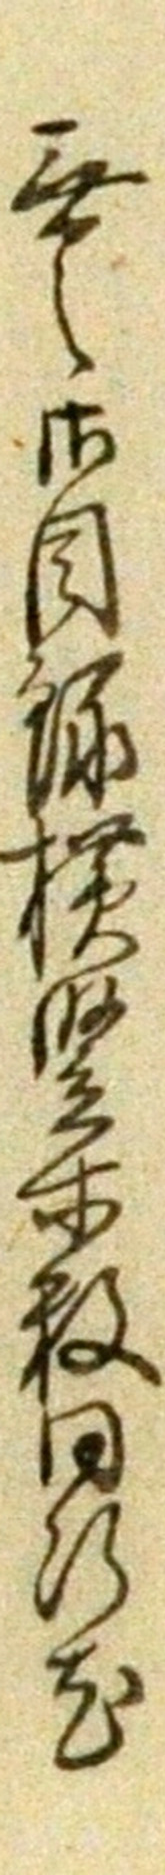無之御目録横竪等等数同断尤
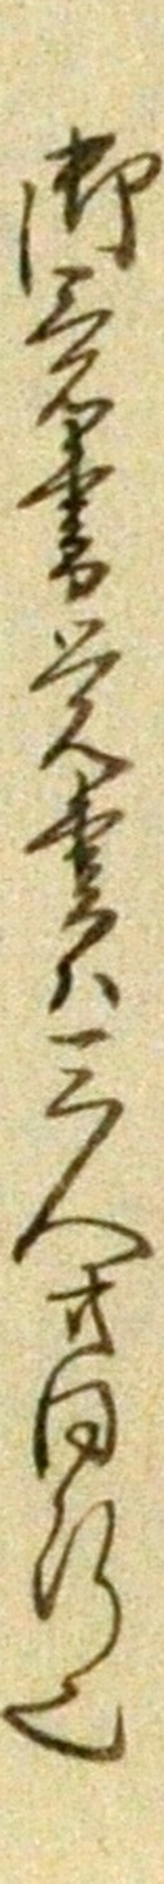御意書覚書ハ三人共同断也
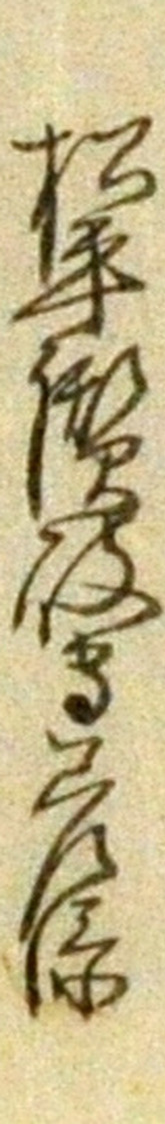松平讃岐守差添
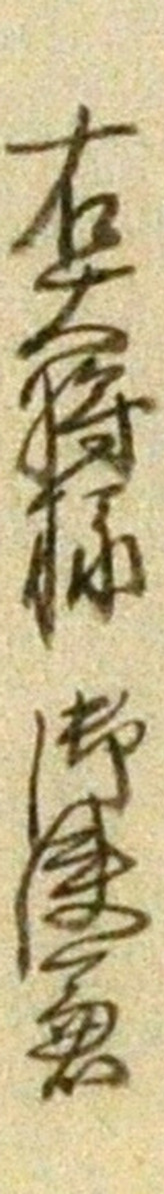右大将様御使兼
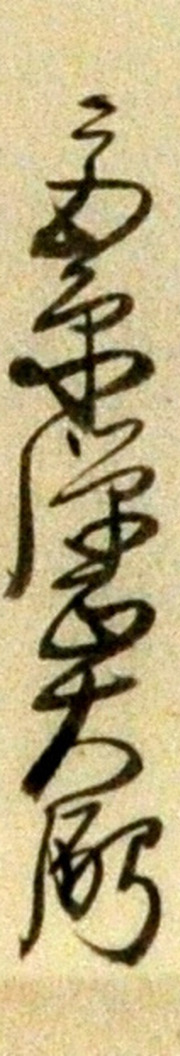宮原弾正大弼
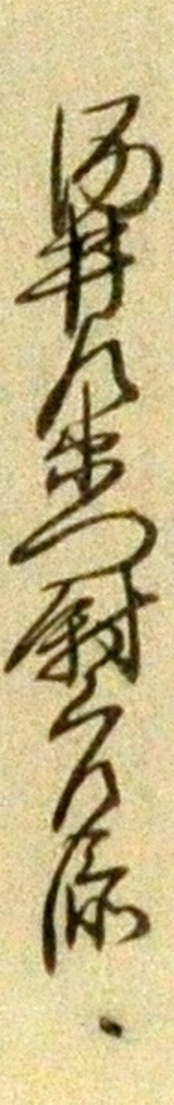酒井左衛門尉差添
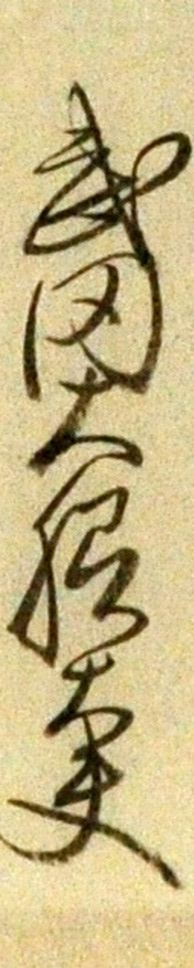武田大膳大夫
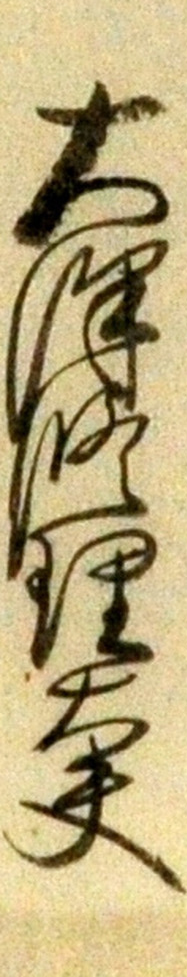大澤修理大夫
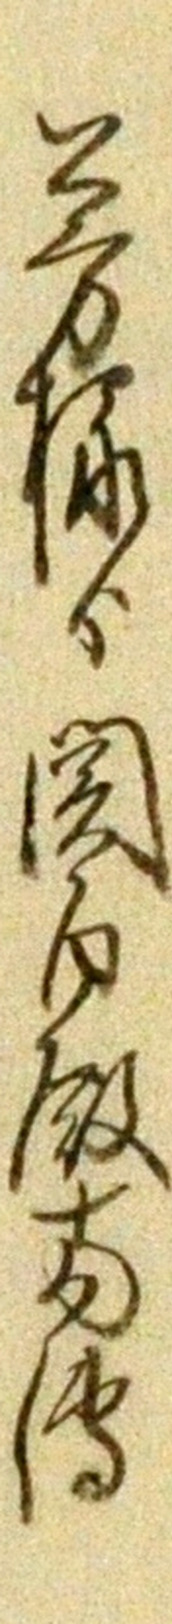公方様ゟ関白殿両伝
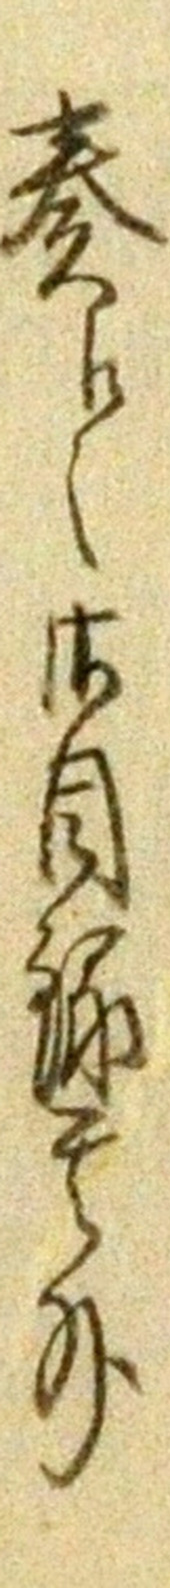奏え之御目録其外
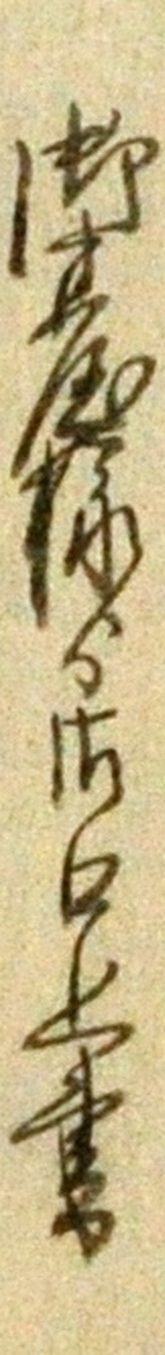御台様ゟ御口上書
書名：御馳走御能ノ節ノ留外
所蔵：伊那市立高遠町図書館・合同会社AMANE
